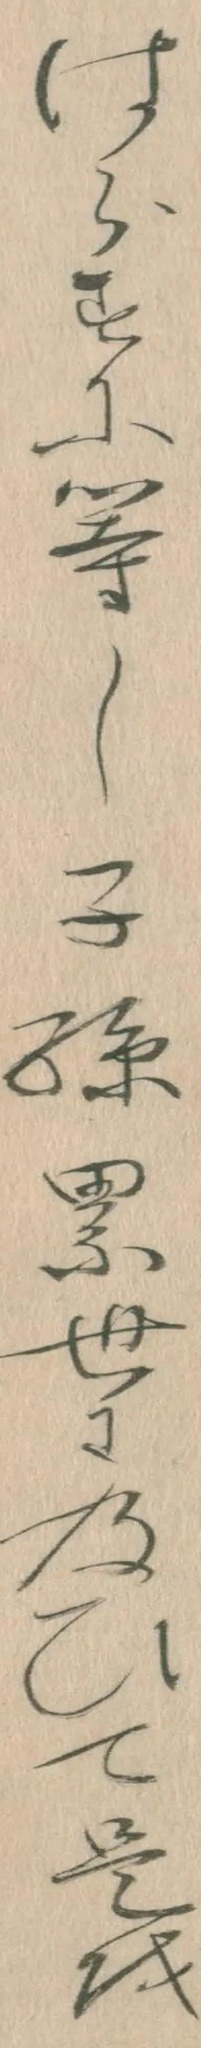さらすに等し子孫累世に及ひて是を
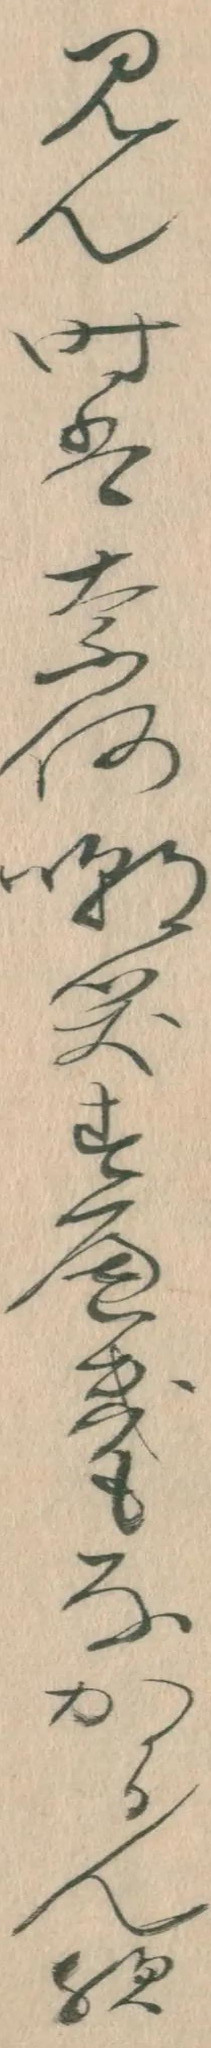見ん時は奈何嘲笑すへきもなからんや
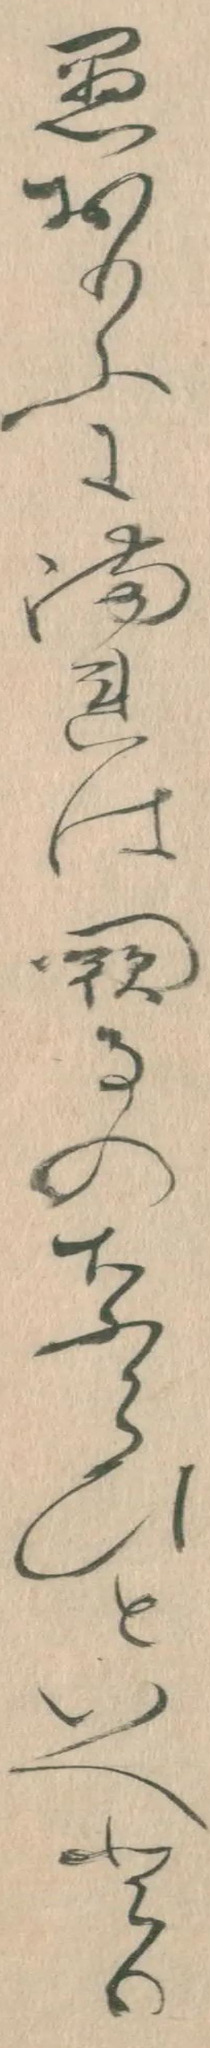愚おもふに満れは闕るのならひといへとも
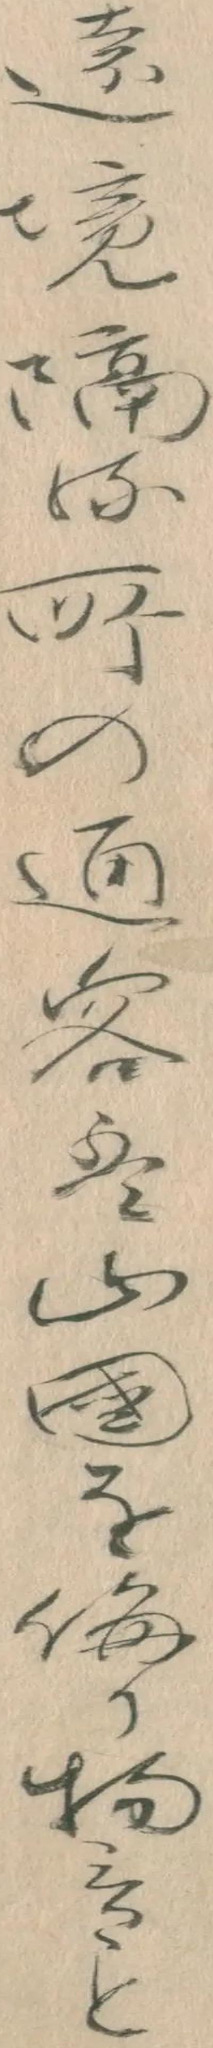遠境隔る所の通客は山国を侮り物言こと
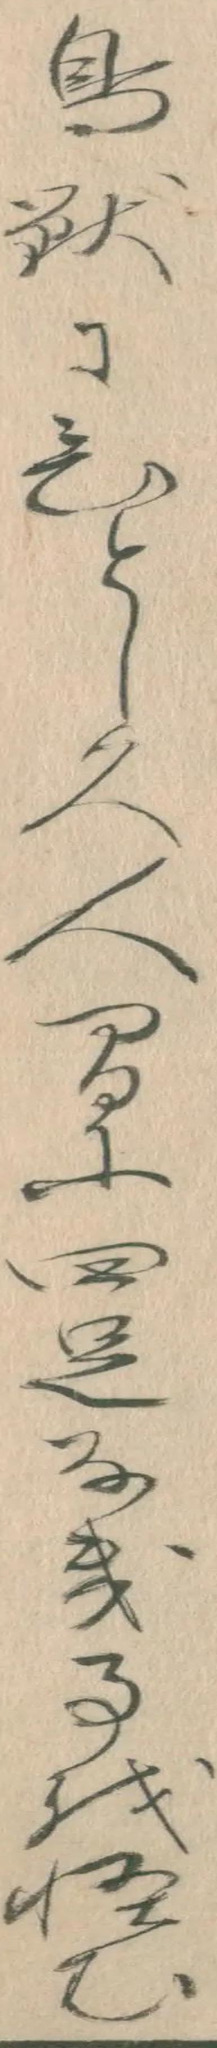鳥獣にひとしく人間に四足なき事を怪む

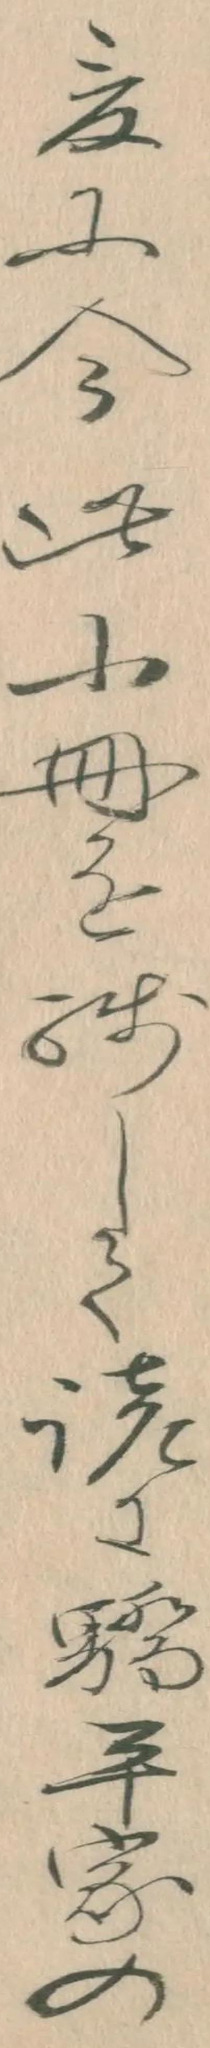爰に今此小冊を残して諺に驕平家の
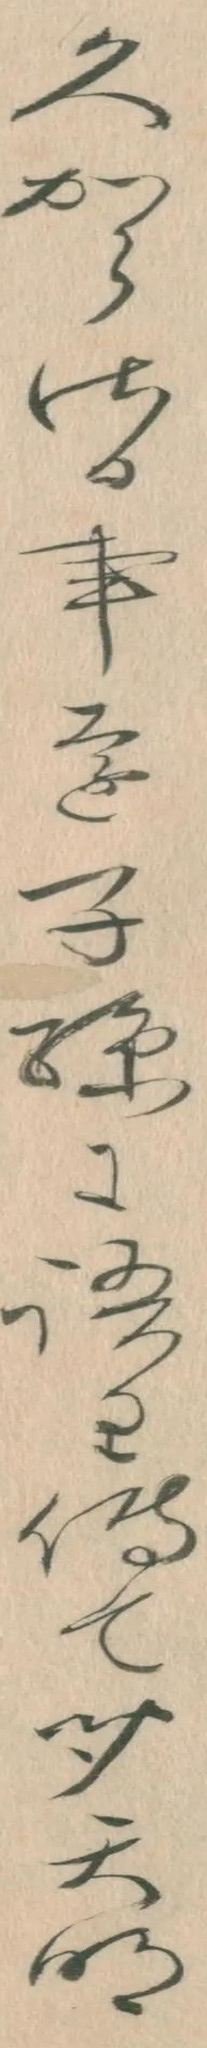久からさる事を子孫に語り伝て聞天明
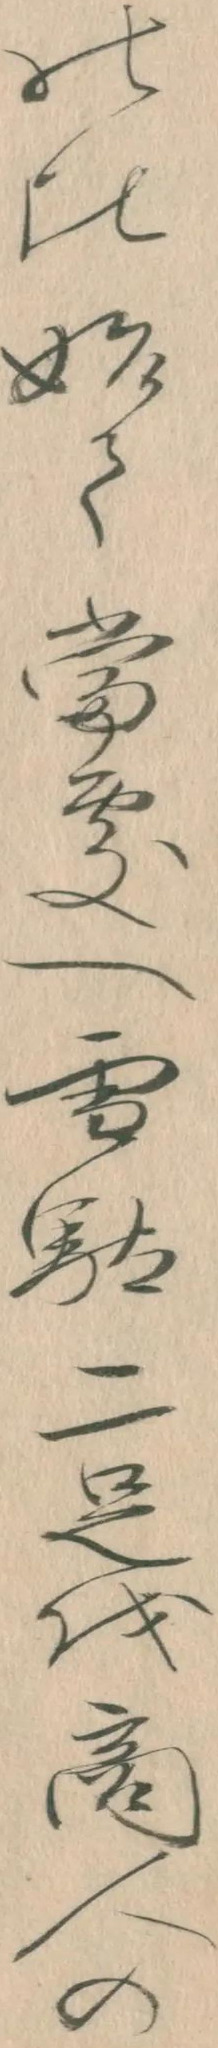の頃始て当処へ雪駄二足を商人の
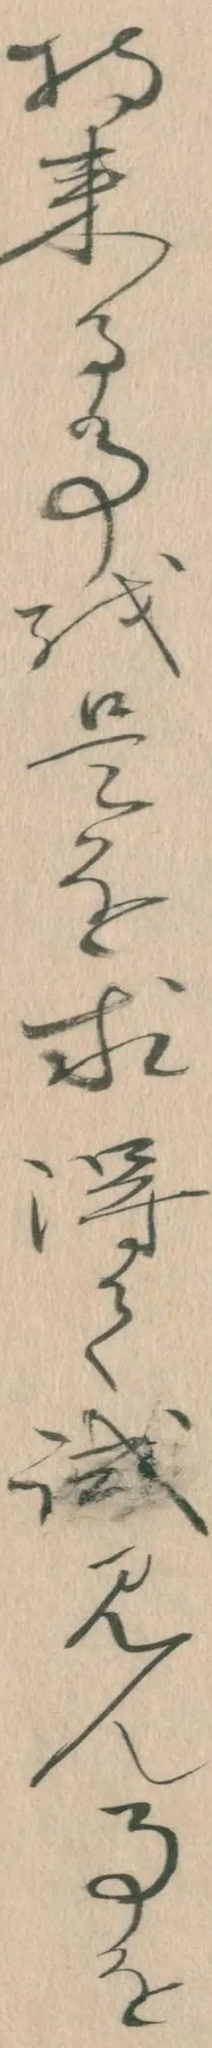持来る事を是を求得て試見ん事を
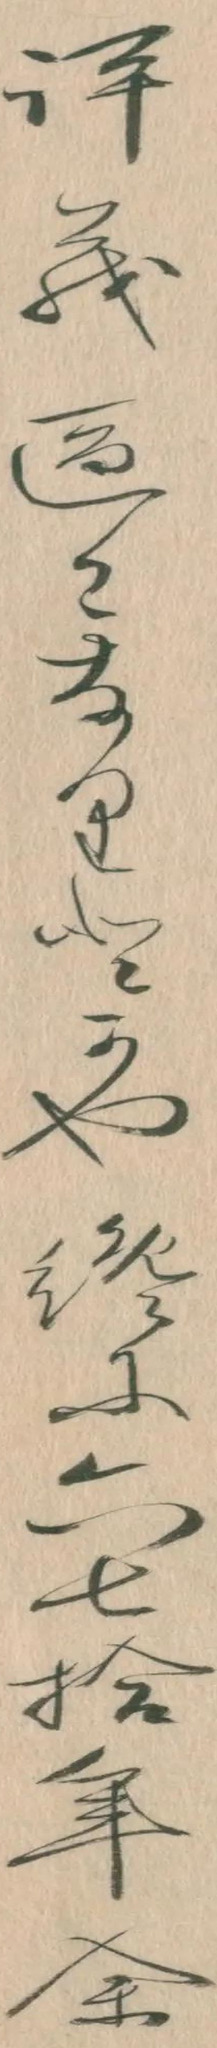評議区々なりとかや纔に六七拾年余
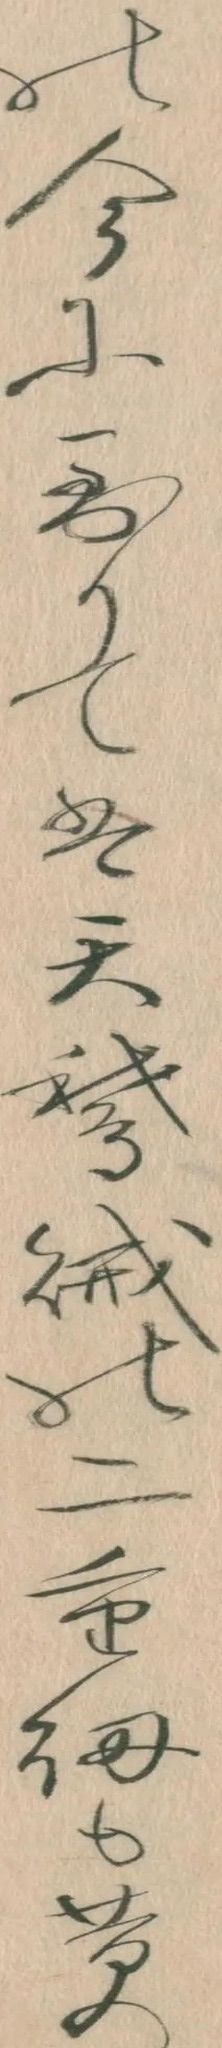の今に至りては天鵞絨の二重紐も昔の
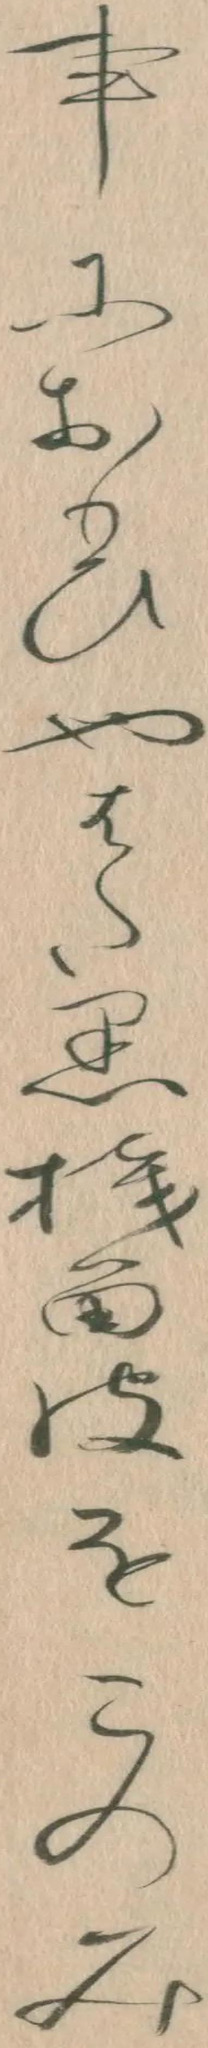事におもひやはた黒桟留皮をこのみ
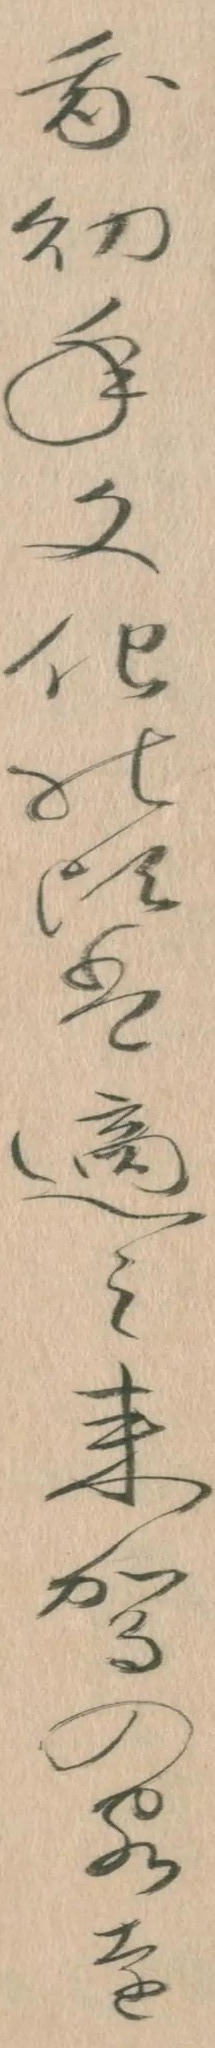我幼年文化の頃は適々来駕の客を
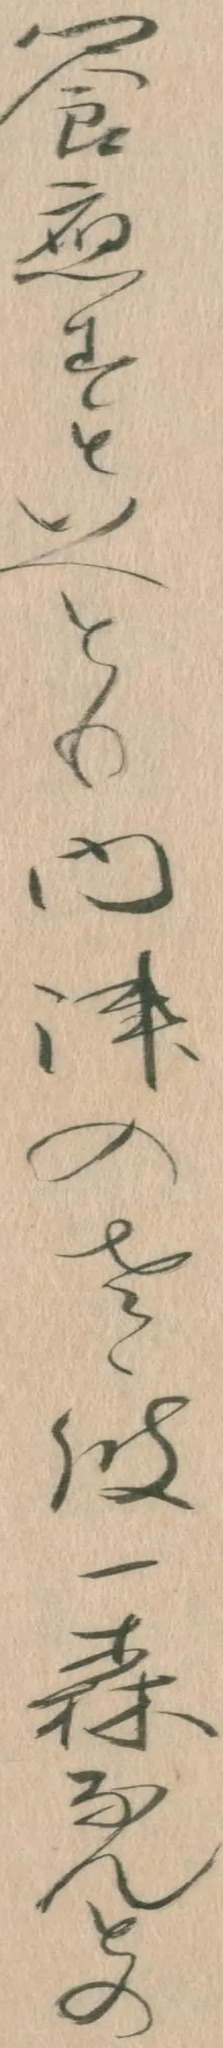饗応すといへとも内津のさゝ波一森なんとの
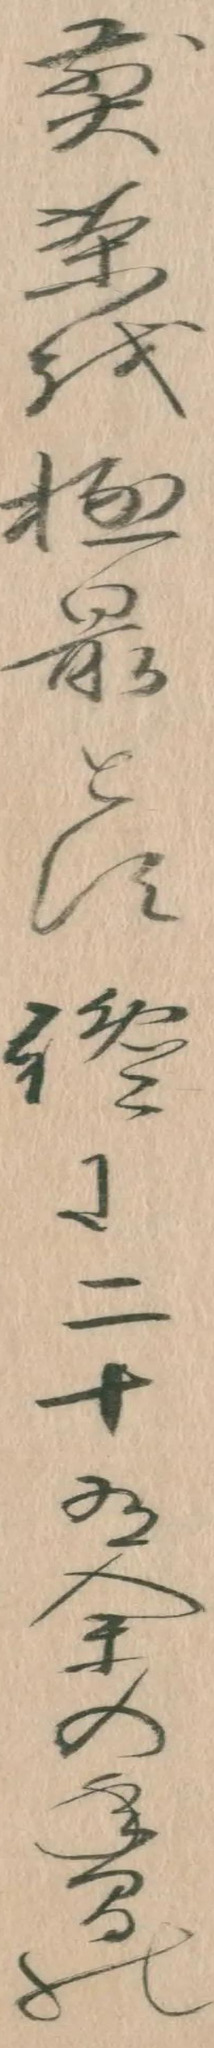煎茶を極最とす讒に二十有余の年間の
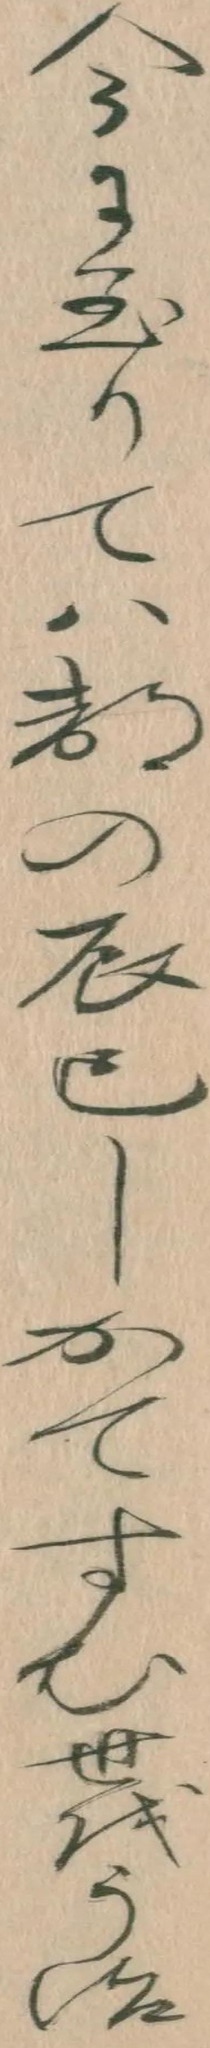今に至りては都の辰巳しかそすむ世を宇治
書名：俗語之種. [1]
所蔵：国立国会図書館 National Diet Library, JAPAN
